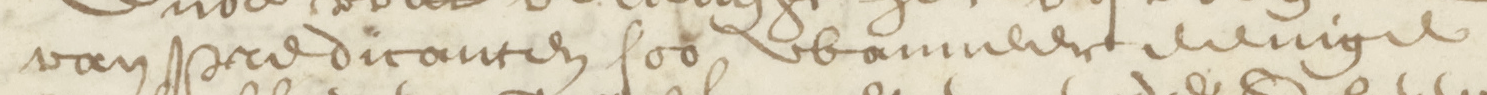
van predicanten soo wanneer eenige
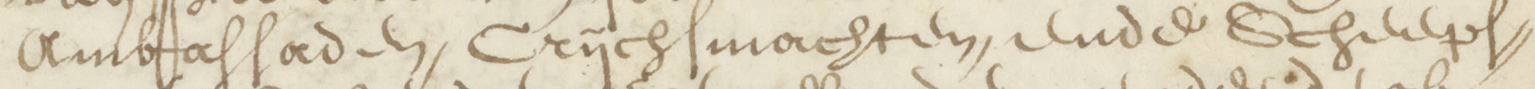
Ambassaden, Crijchsmachten, ende Scheeps„
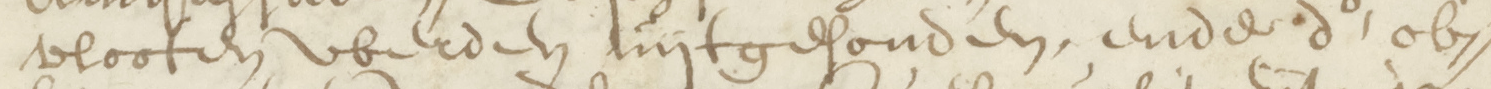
vlooten werden uijtgesonden, ende d'ob„
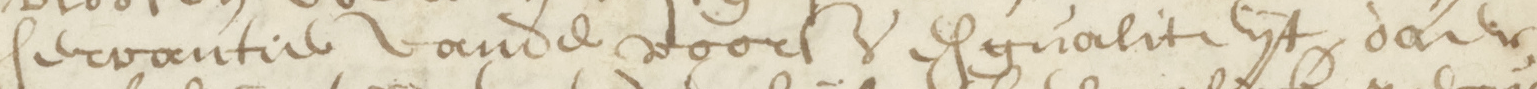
servantie vande voors Esgualiteijt daer
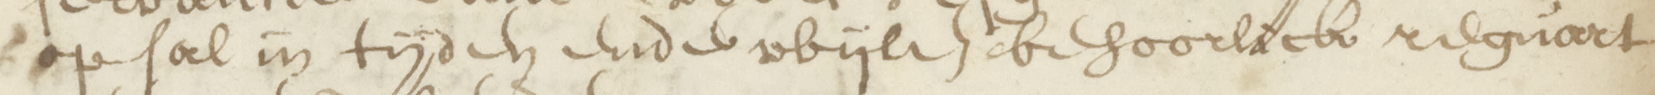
op sal in tijden ende wijlen behoorlick reguart
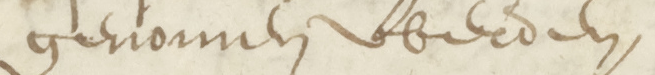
genomen werden.
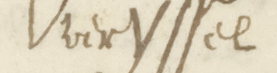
OverYssel
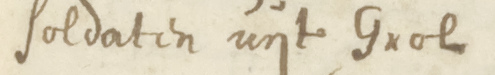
soldaten uijt Grol
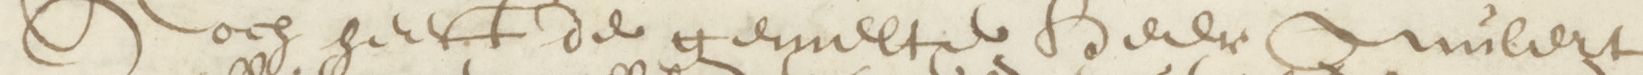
Noch heeft de gemelte Heer Mulert
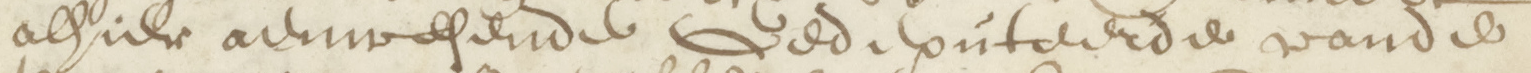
alhier aenwesende Gedeputeerde vande
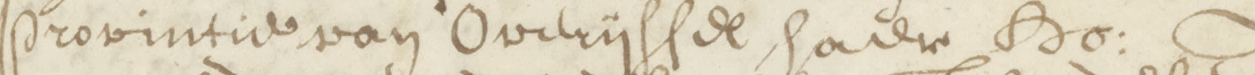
Provintie van Overijssel, haer Ho:Mo:
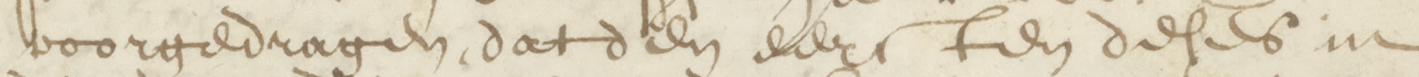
voorgedragen, dat den eersten deses in
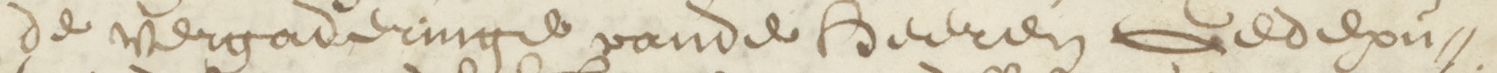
de Vergaderinge vande Heeren Gedepu„
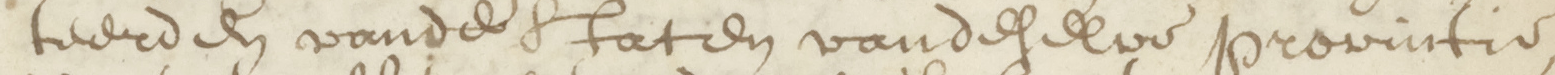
teerden vande Staten van deselve provintie
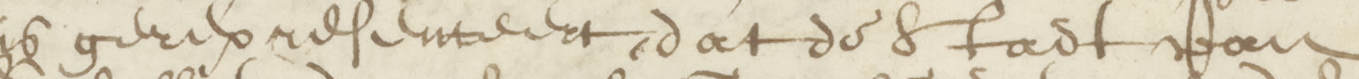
is gerepresenteert, dat de Stadt van
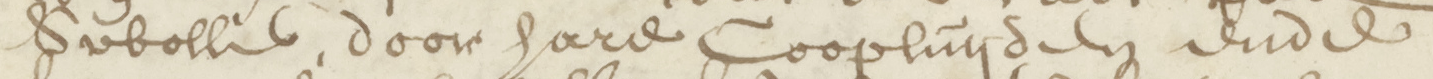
Swolle door hare Coopluijden ende
